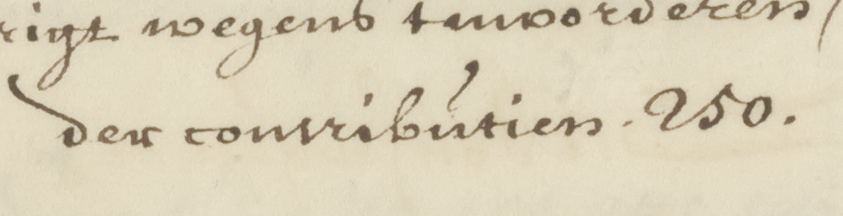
der contributien, 250.
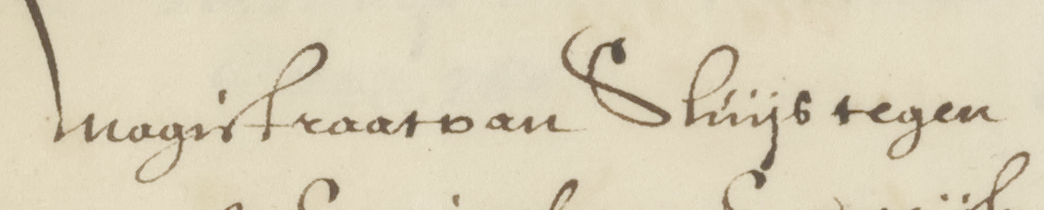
Magistraat van Sluijs tegen
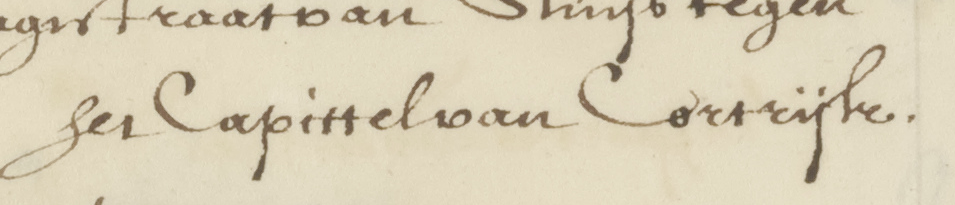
het Capittel van Cortrijk.
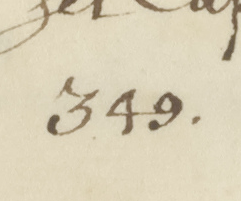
349.
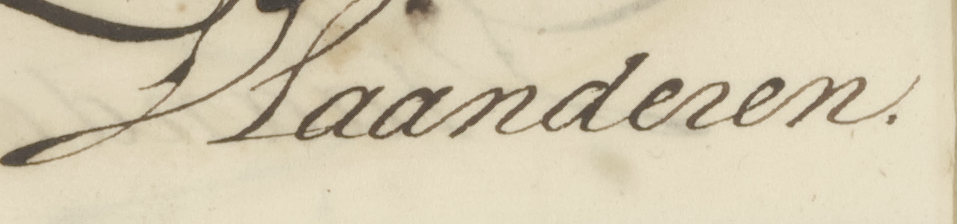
Vlaanderen.
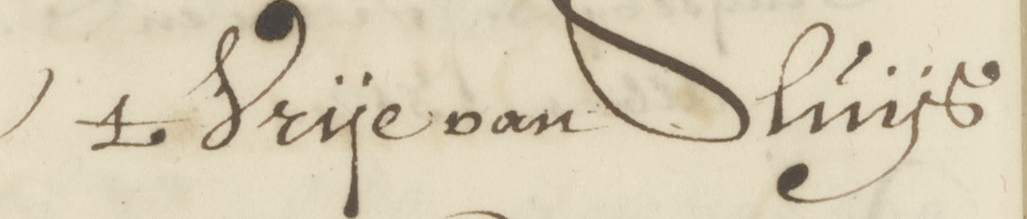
t Vrije van Sluijs
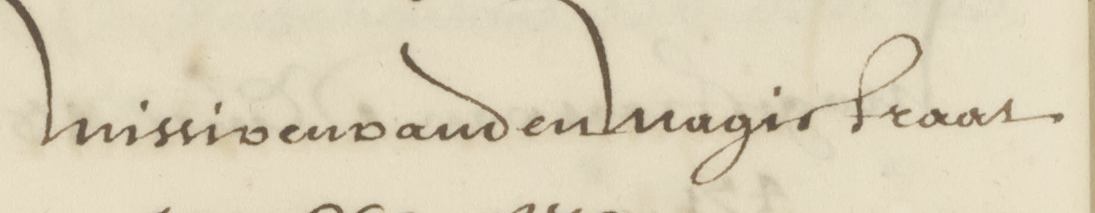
missiven vanden Magistraat
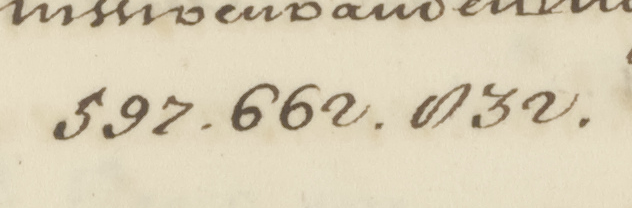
597, 662, 832.
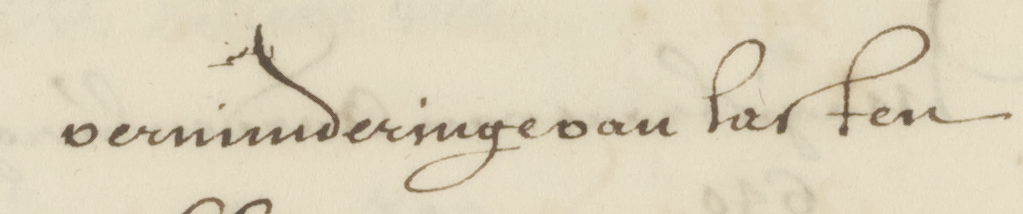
verminderinge van lasten
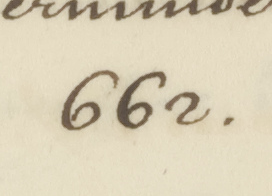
662.
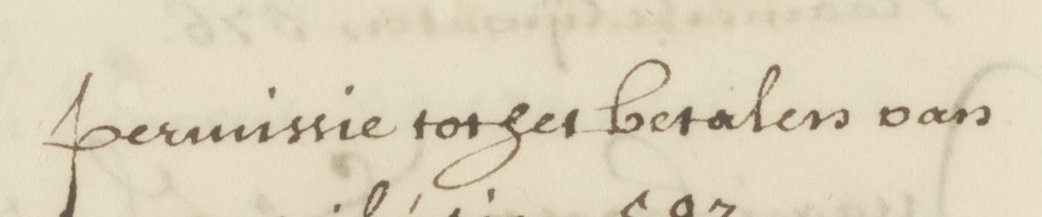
permissie tot het betalen van
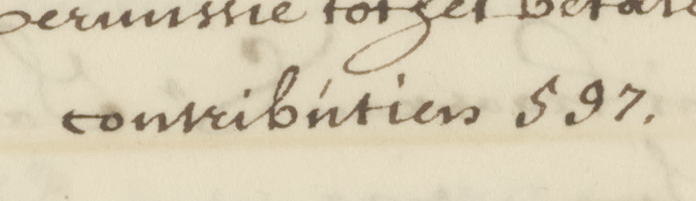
contributien 597.
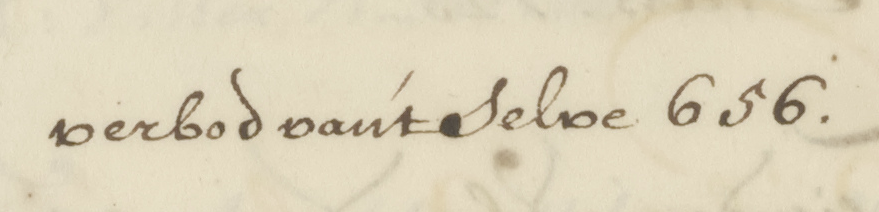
verbod van't selve 656.
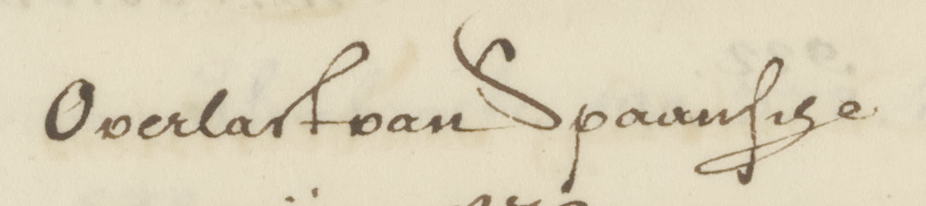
Overlast van Spaansche
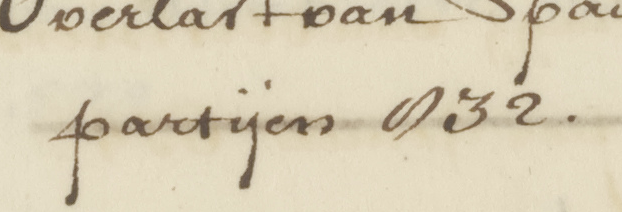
partijen 832.
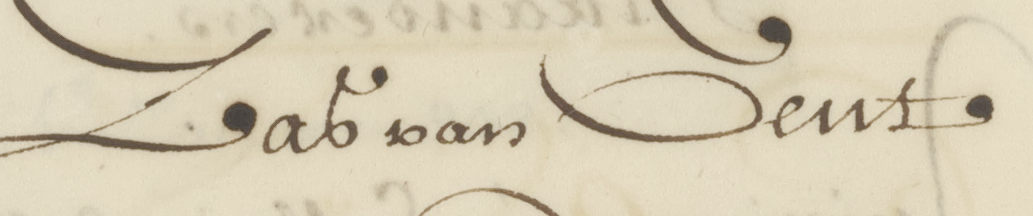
Zas van Gent
